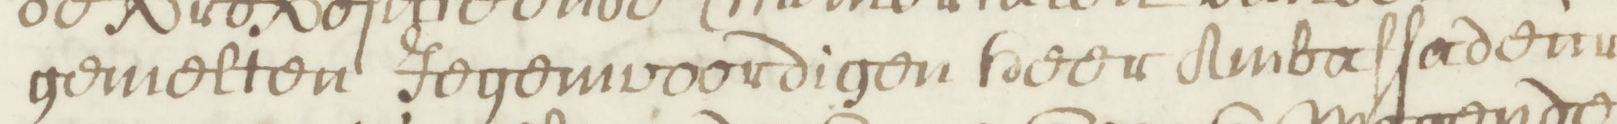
gemelten Jegenwoordigen heer Ambassadeur
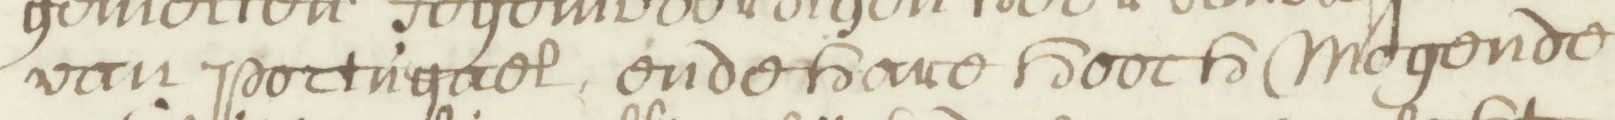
van portugael, ende hare Hooch Mogende
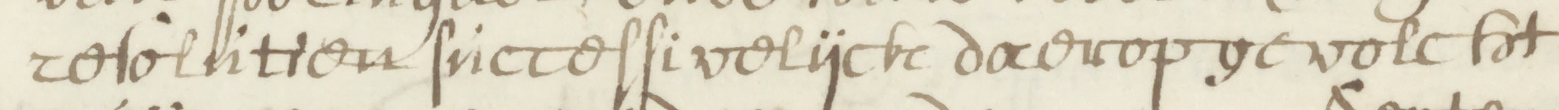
resolutien successivelijck daerop gevolcht
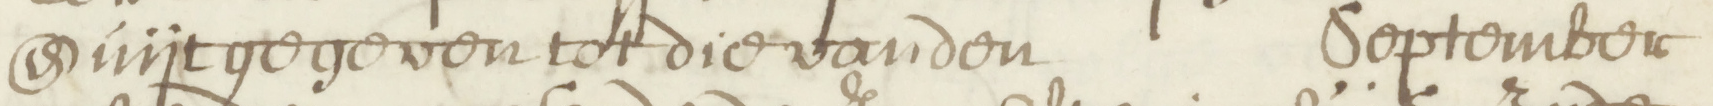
& uijtgegeven tot die vanden .. September
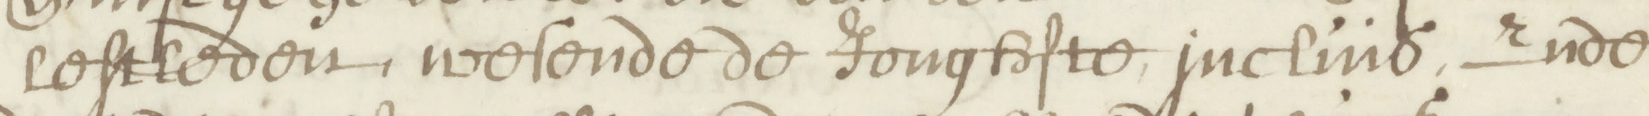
lestleden, wesende de Jonghste, incluis. Ende
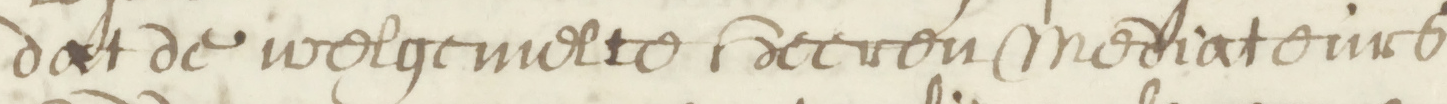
dat de welgemelte heeren Mediateurs
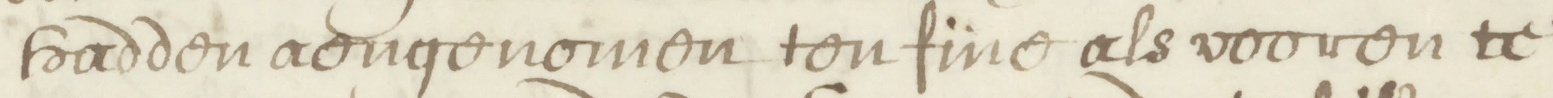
hadden aengenomen ten fine als vooren te
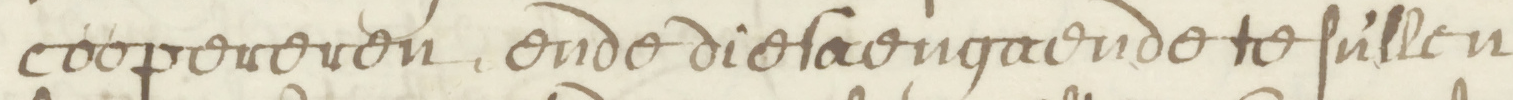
cöopereren, ende diesaengaende te sullen
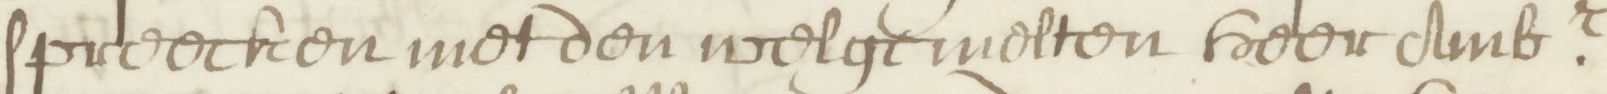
spreecken met den welgemelten heer Ambr.
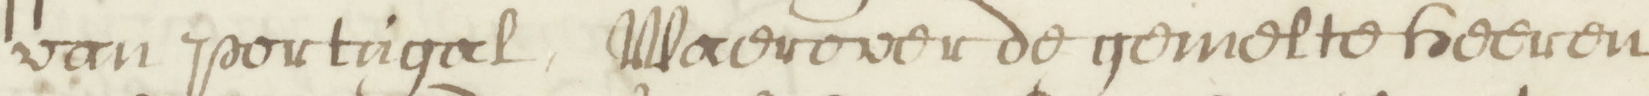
van portugal. Waerover de gemelte heeren
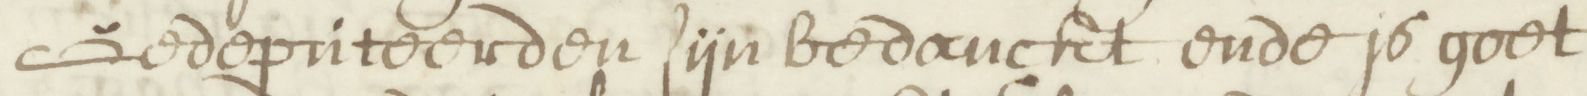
Gedeputeerden sijn bedanckt, ende is goet
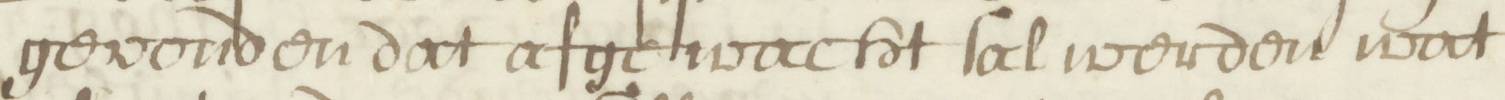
gevonden dat afgewacht sal werden wat
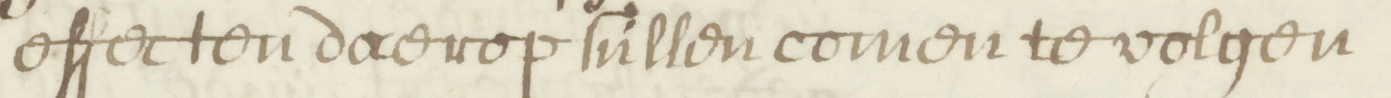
effecten daerop sullen comen te volgen.
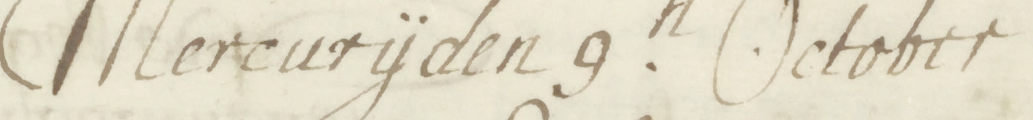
Mercurij den 9n. October
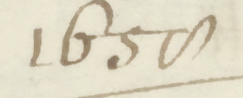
1658
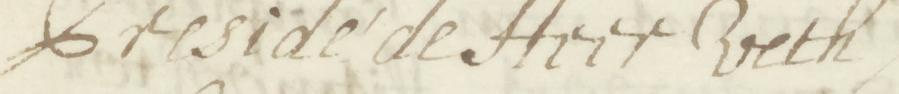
Preside‛ de Heer Veth
